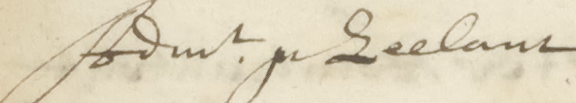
Admt. in Zeelant
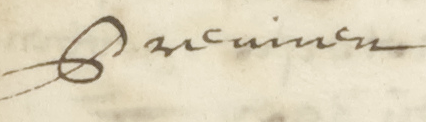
Premien
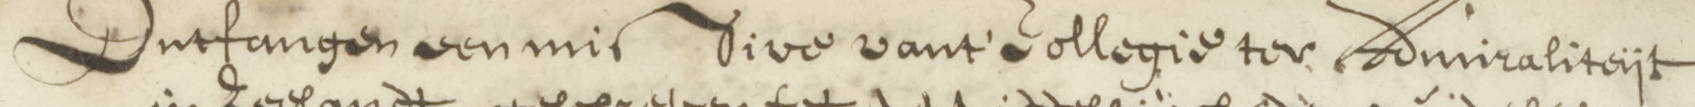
Ontfangen een missive vant' Collegie ter Admiraliteijt
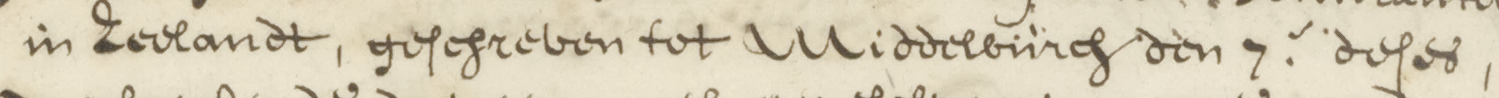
in Zeelandt, geschreven tot Middelburch den 7e. deses,
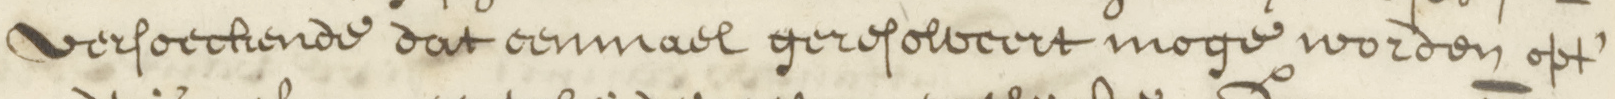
versoeckende dat eenmael geresolveert moge worden opt'
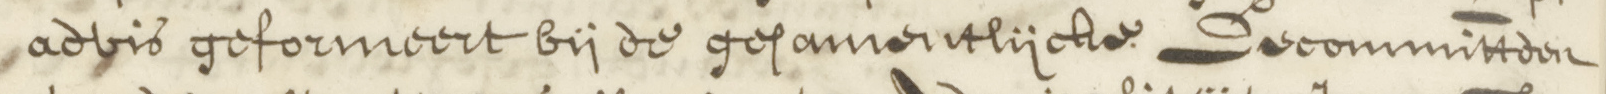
advis geformeert bij de gesamentlijcke Gecommittden
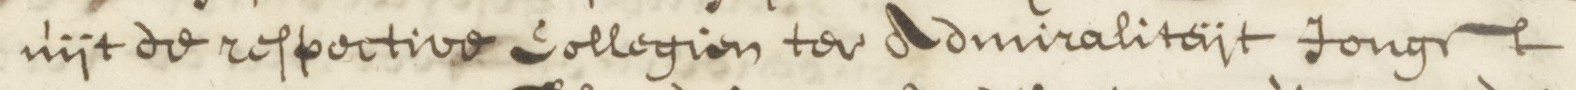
uijt de respective Collegien ter Admiraliteijt Jongst
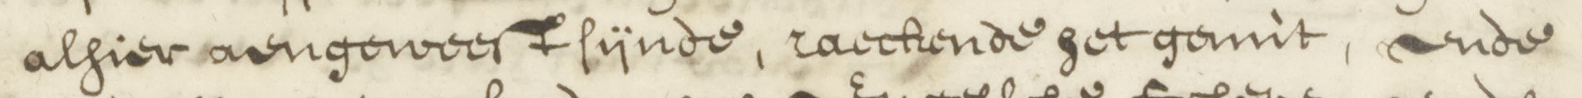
alhier aengeweest sijnde, raeckende het genut, ende
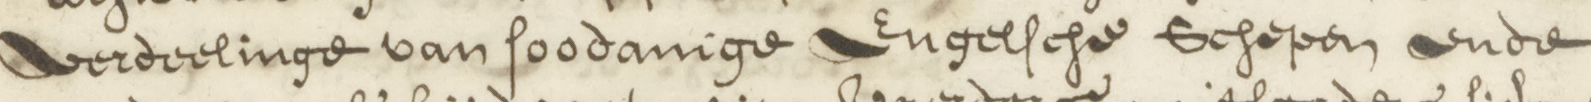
verdeelinge van soodanige Engelsche Schepen ende
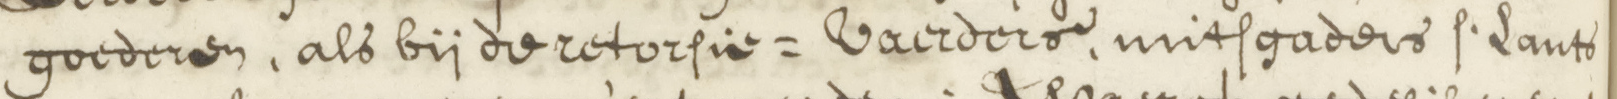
goederen, als bij de retorsie=vaerders, mitsgaders s'Lants
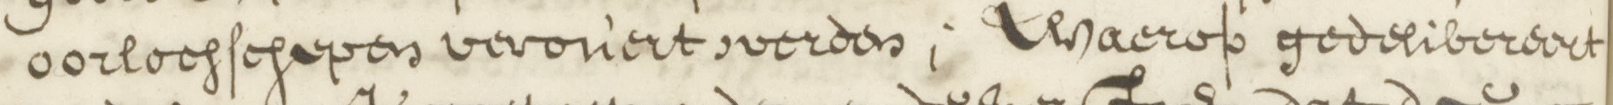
oorlochschepen verouert werden; Waerop gedelibereert
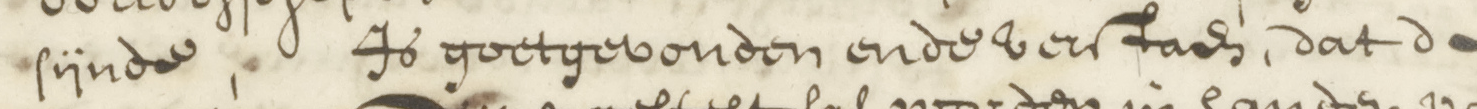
sijnde, Is goetgevonden ende verstaen, dat de
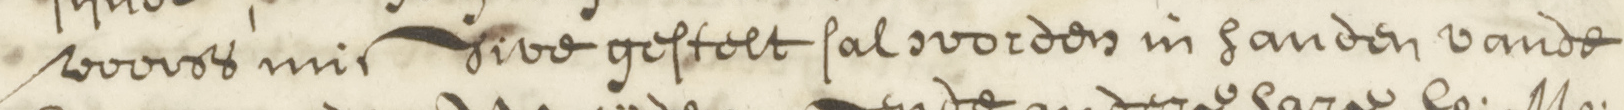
voorsz missive gestelt sal worden in handen vande
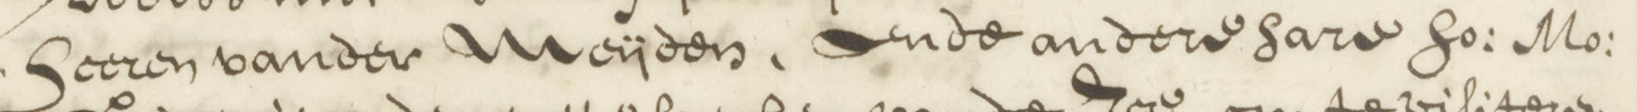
heeren vander Meijden, ende andere hare Ho:Mo:
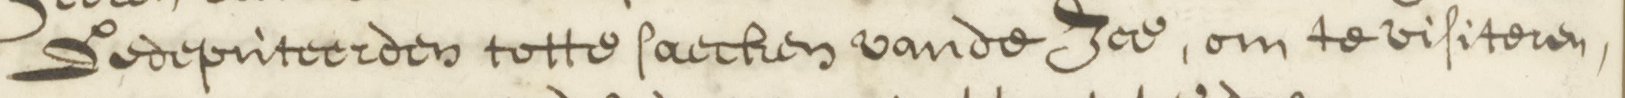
Gedeputeerden totte saecken vande Zee, om te visiteren,
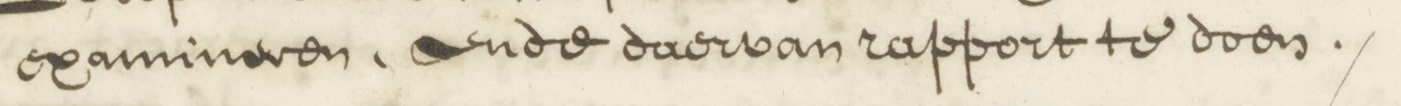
examineren, ende daervan rapport te doen.
